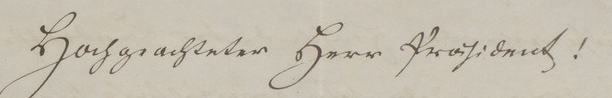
Hochgeachteter Herr Präsident!
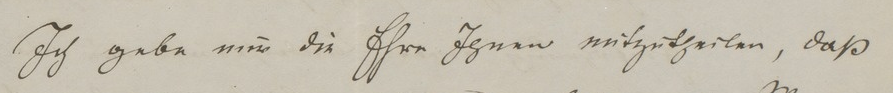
Ich gebe mir die Ehre Ihnen mitzutheilen, daß
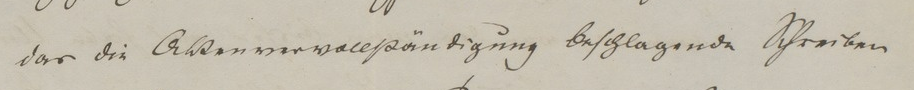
das die Aktenvervollständigung beschlagende Schreiben
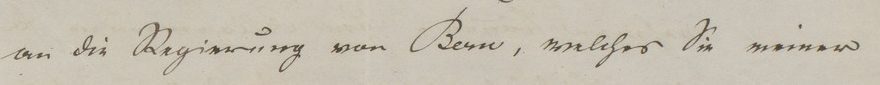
an die Regierung von Bern, welches Sie meiner
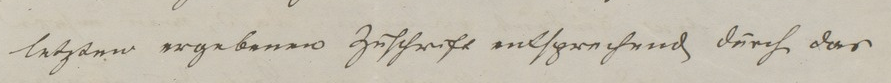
letzten ergebenen Zuschrift entsprechend durch das
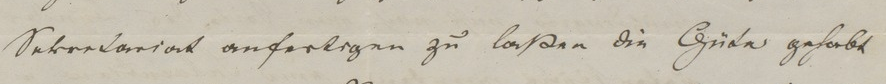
Sekretariat anfertigen zu laßen die Güte gehabt
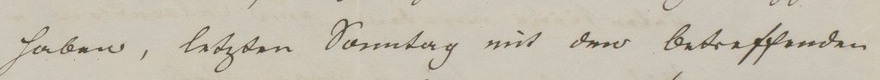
haben, letzten Sonntag mit den betreffenden
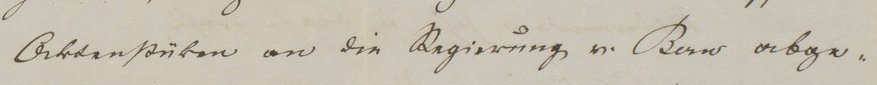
Aktenstüken an die Regierung v. Bern abge-
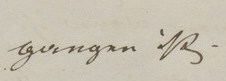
gangen ist. –
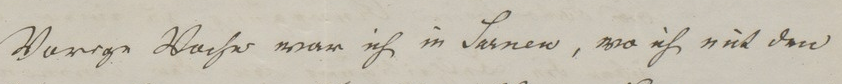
Vorige Woche war ich in Sarnen, wo ich mit den
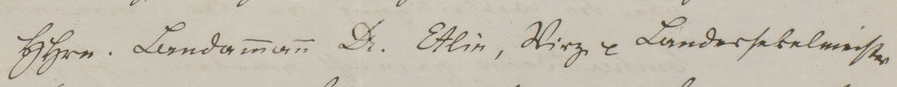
HHrn. Landammann Dr. Etlin, Wirz & Landessekelmeister
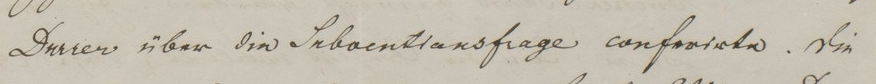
Durrer über die Subventionsfrage conferirte. Die
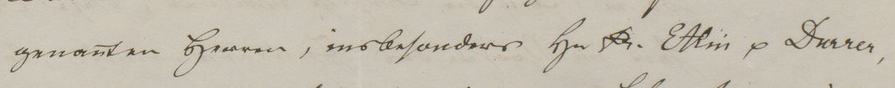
genannten Herren, insbesonders Hr Dr. Etlin & Durrer,
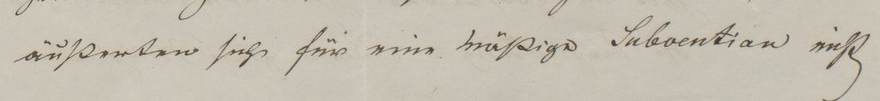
äußerten sich für eine mäßige Subvention nicht
